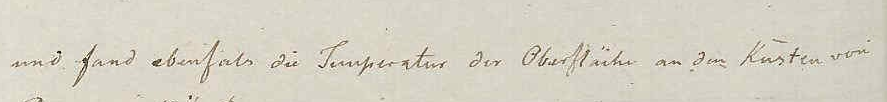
und fand ebenfals die Temperatur der Oberfläche an den Küsten von
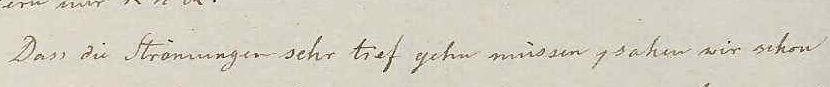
Dass die Strömungen sehr tief gehn müssen, sahen wir schon
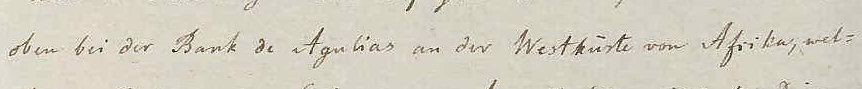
oben bei der Bank de Agulias an der Westküste von Afrika, wel-
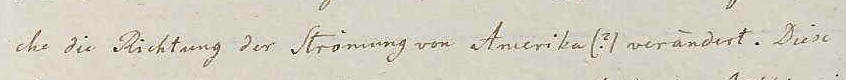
che die Richtung der Strömung von Amerika verändert. Diese
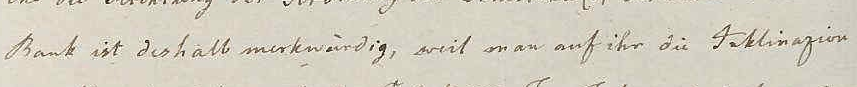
Bank ist deshalb merkwürdig, weil man auf ihr die Inklinazion
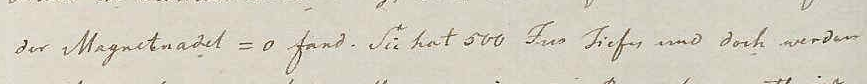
der Magnetnadel 0 fand. Sie hat 500 Fus Tiefes und doch werden
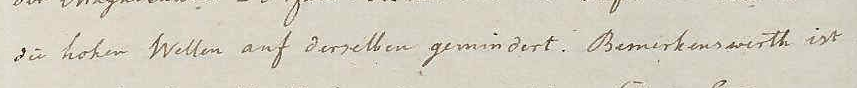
die hohen Wellen auf derselben gemindert. Bemerkenswerth ist
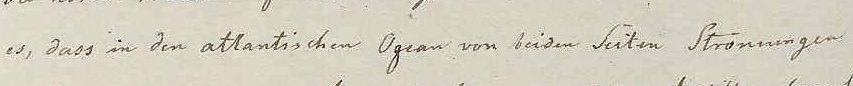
es, dass in den atlantischen Ozean von beiden Seiten Strömungen
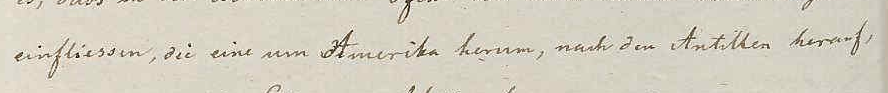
einfliessen, die eine um diAmerika herum, nach den Antillen herauf,
